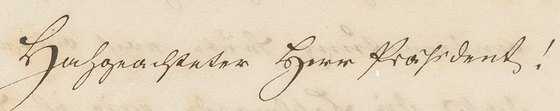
Hochgeachteter Herr Präsident!
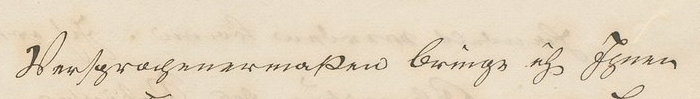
Versprochenermaßen bringe ich Ihnen
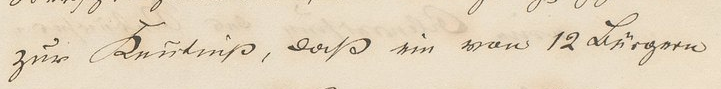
zur Kenntniß, daß ein von 12 Bürgern
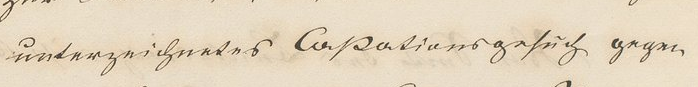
unterzeichnetes Caßationsgesuch gegen
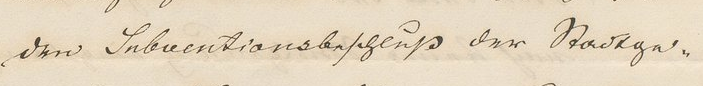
den Subventionsbeschluß der Stadtge-
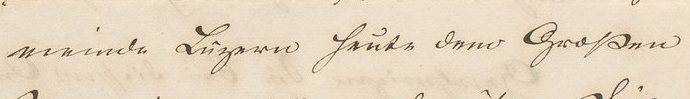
meinde Luzernheute dem Großen
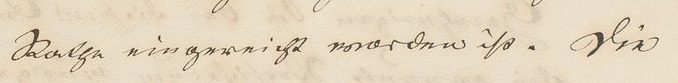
Rathe eingereicht worden ist. Die
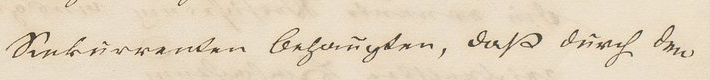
Rekurrenten behaupten, daß durch den
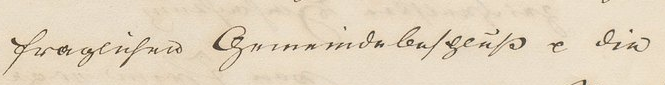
fraglichen Gemeindebeschluß & die
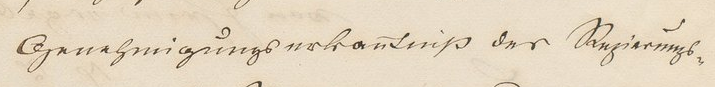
Genehmigungserkanntniß des Regierungs-
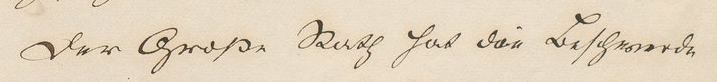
Der Große Rath hat die Beschwerde
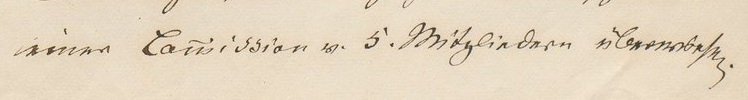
einer Commission v. 5. Mitgliedern überwiesen.
